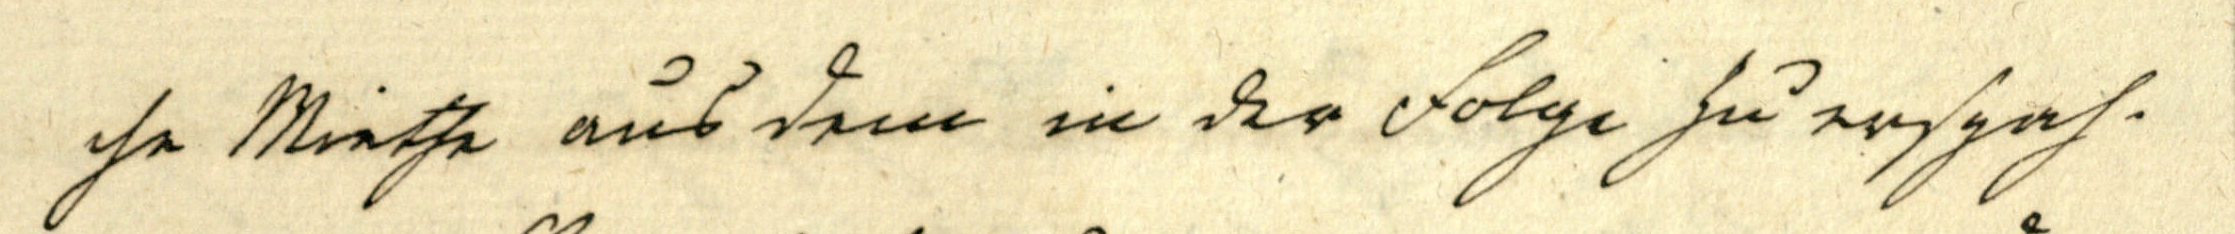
che Miethe aus dem in der Folge zu erspah¬
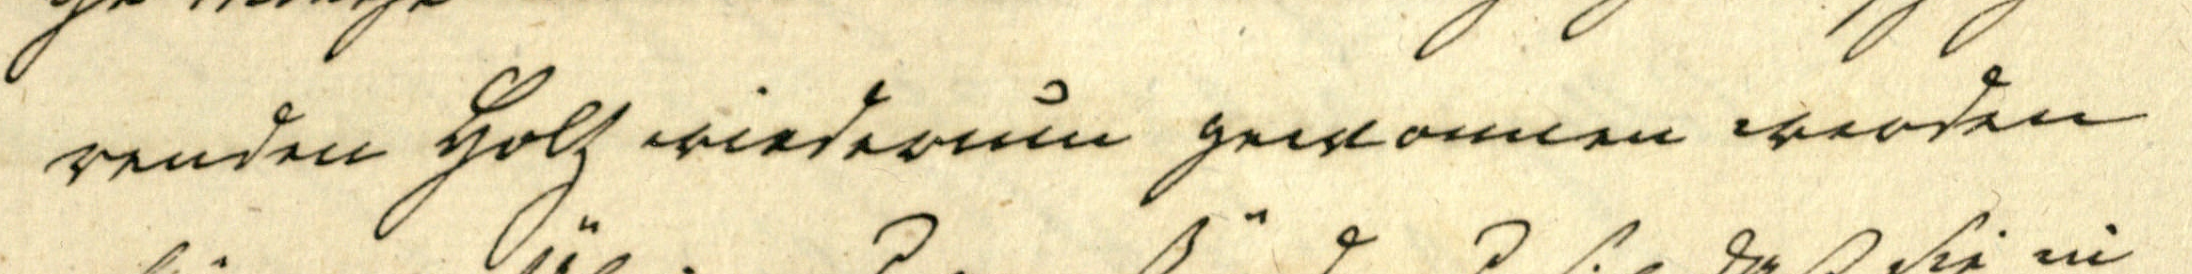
renden Holz wiederum gewonnen werden
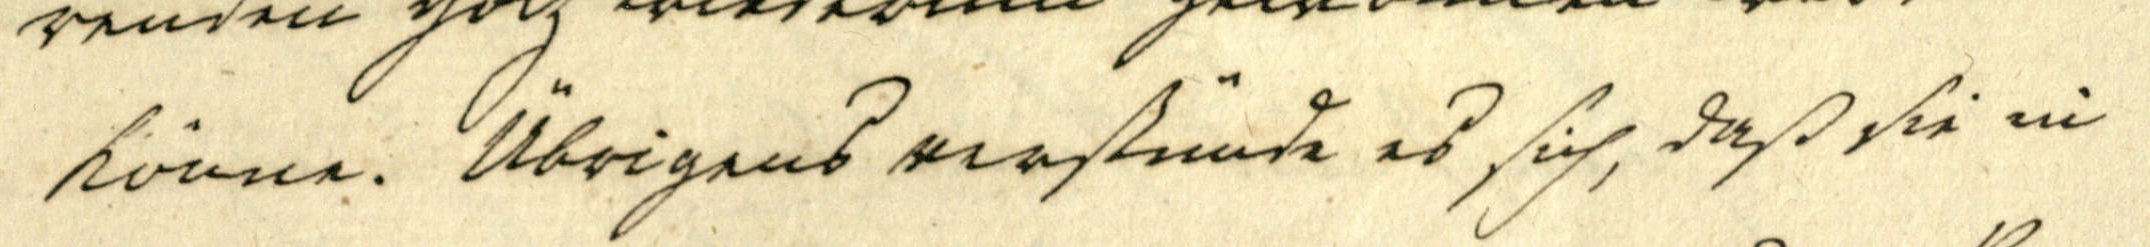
könne. Übrigens verstünde es sich, daß sie in
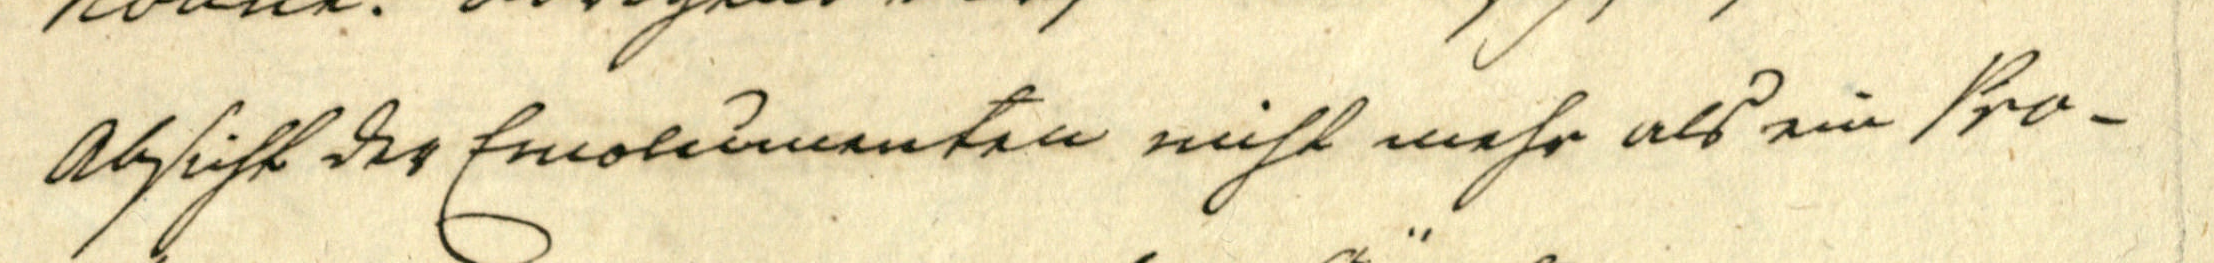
Absicht der Emolumenten nicht mehr als ein Pro¬
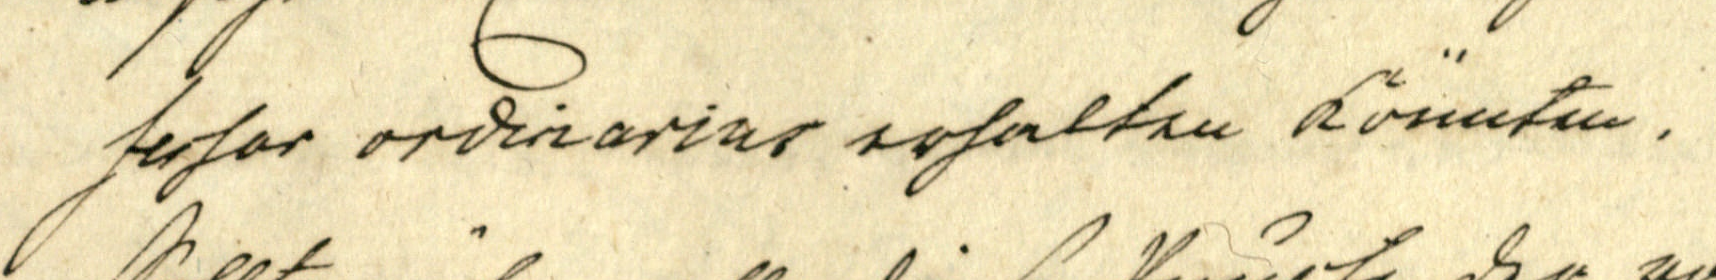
fessor ordinarius erhalten könnten.
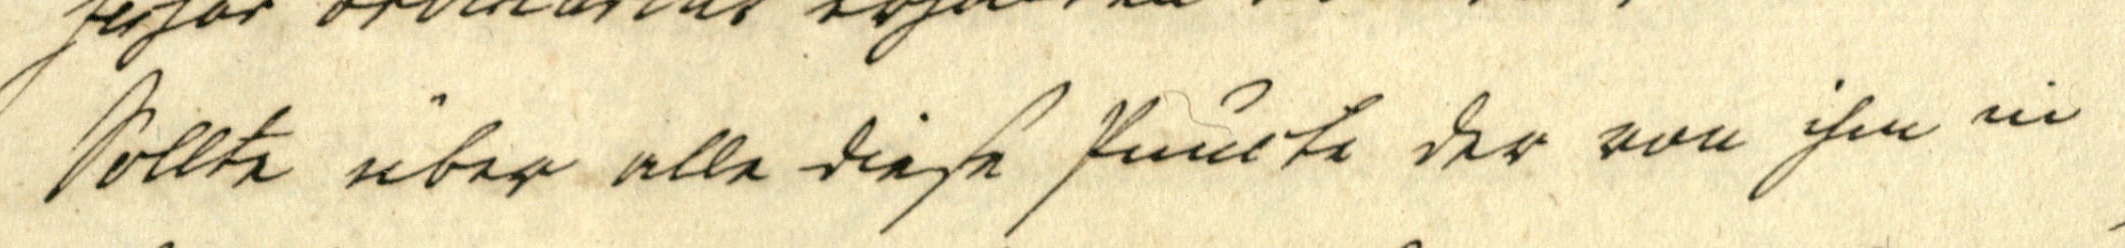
Sollte über alle diese Puncte der von ihm in
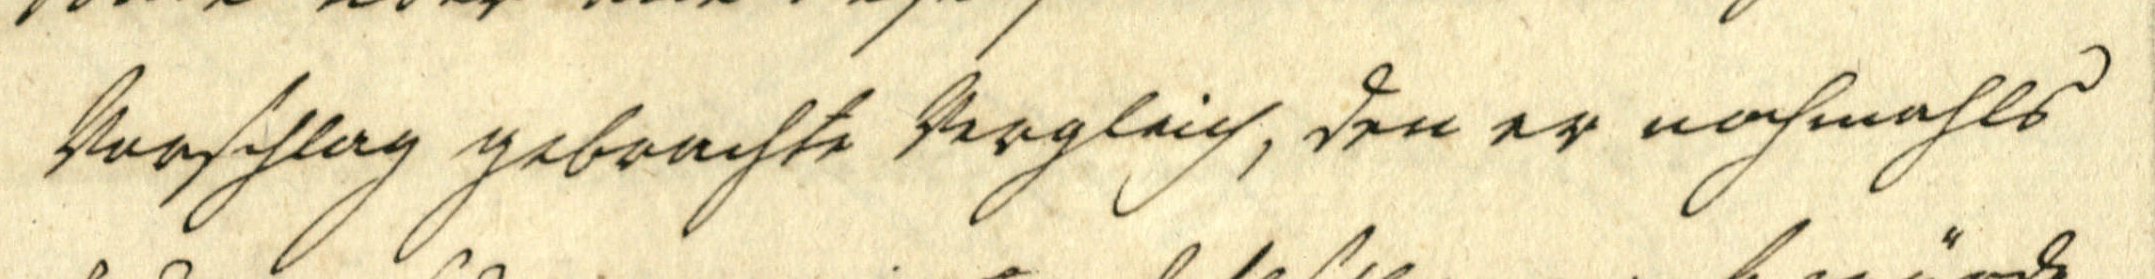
Vorschlag gebrachte Vergleich, den er nochmahls
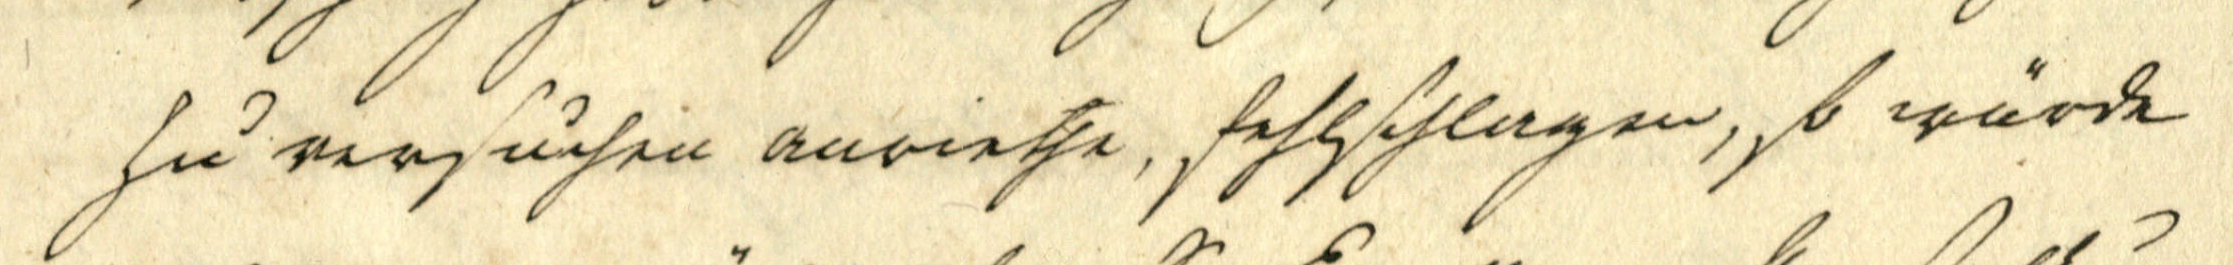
zu versuchen anriethe, fehlschlagen, so würde
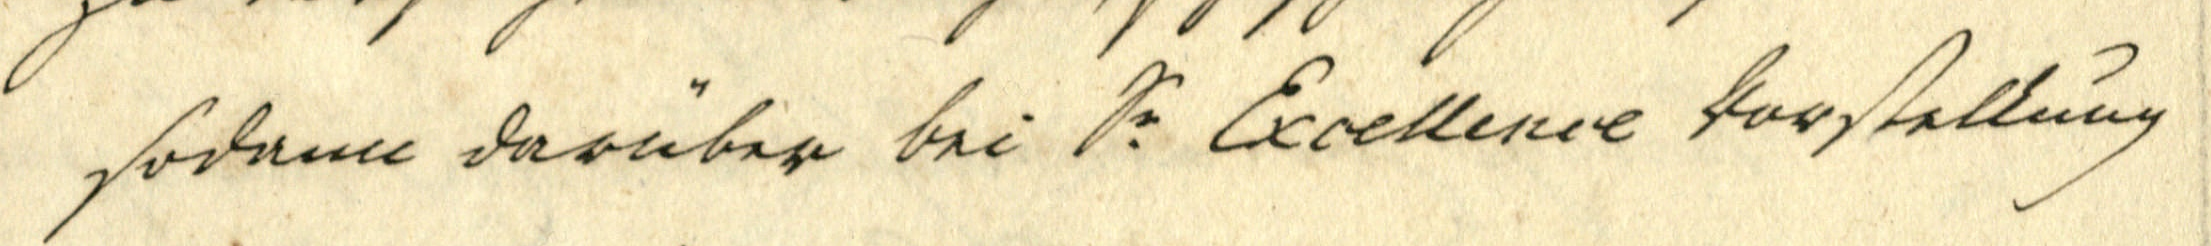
sodann darüber bei Sr. Excellence Vorstellung
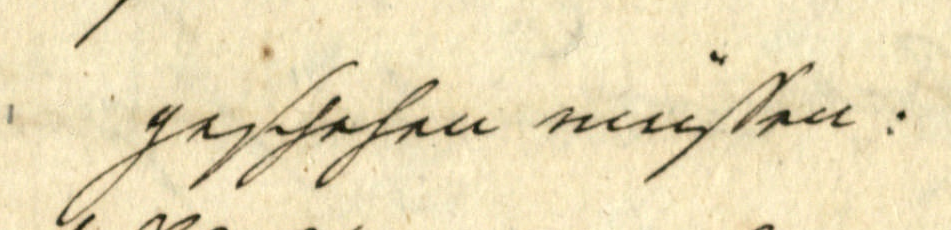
geschehen müssen.
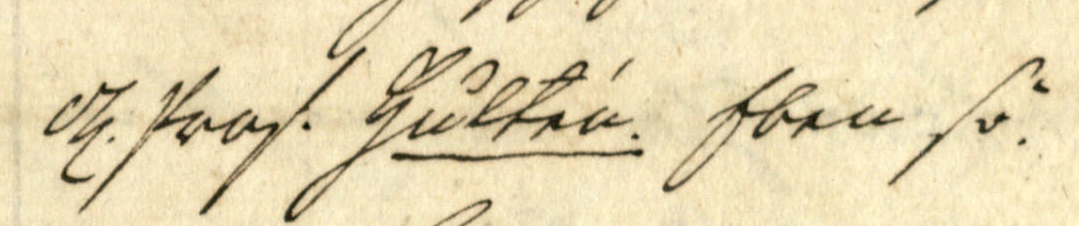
dh. Prof. Hultèn. Eben so.
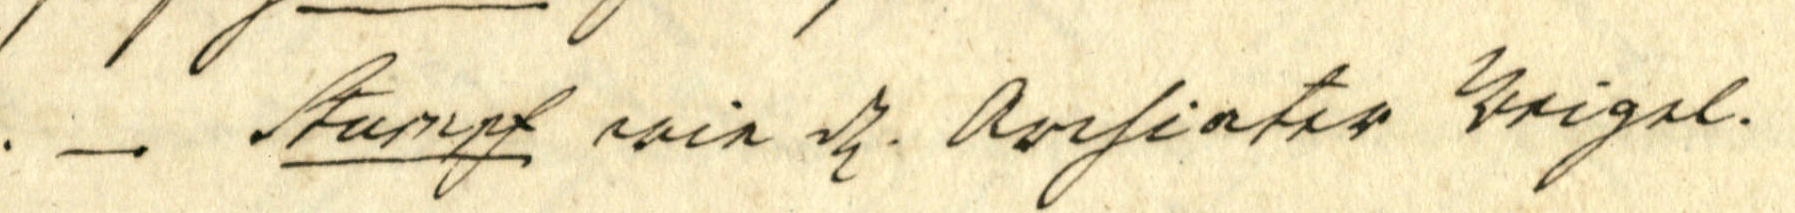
Stumpf wie der Archiater Weigel.
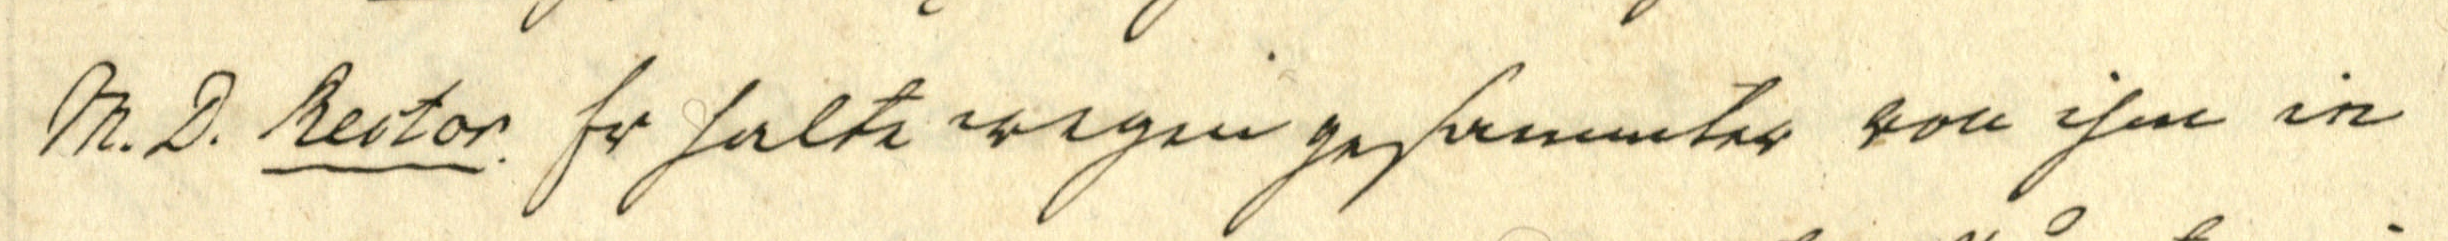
M. D. Rector. Er halte wegen gesammter von ihm in
